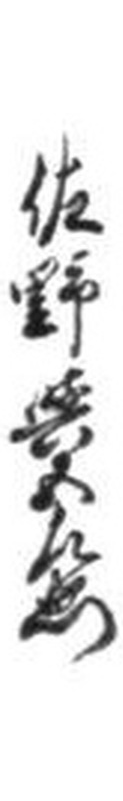佐野与五左衛門
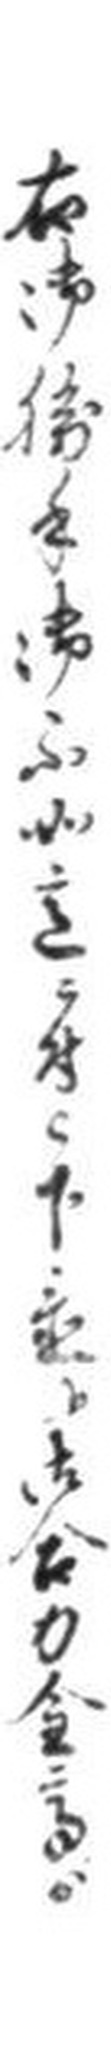右御勝手御不如意ニ付被下置候御合力金高ゟ
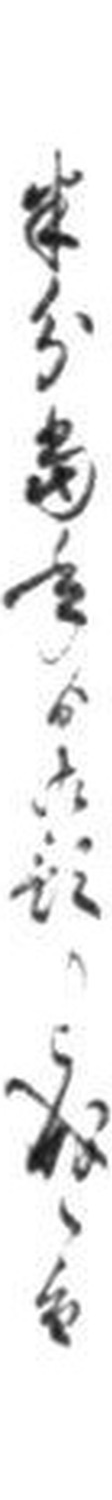半分当年ゟ御預り被成候旨
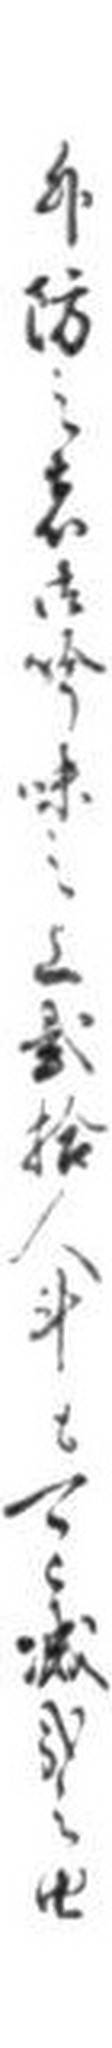外防之者御吟味之上弐拾人斗も可被減哉之由
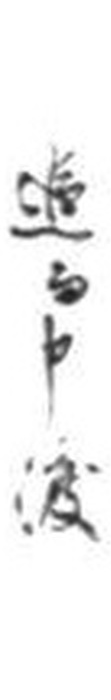追而申渡
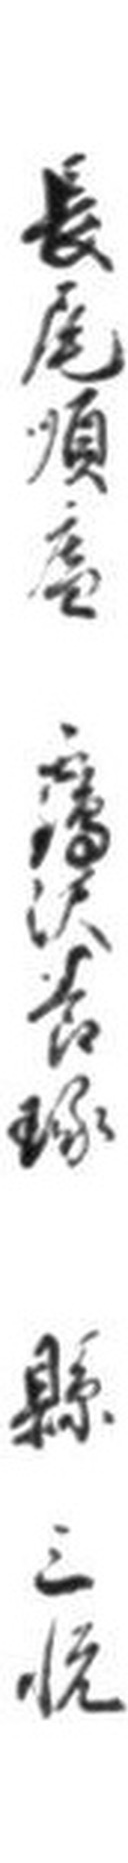長尾順庵鶴沢善琢縣三悦
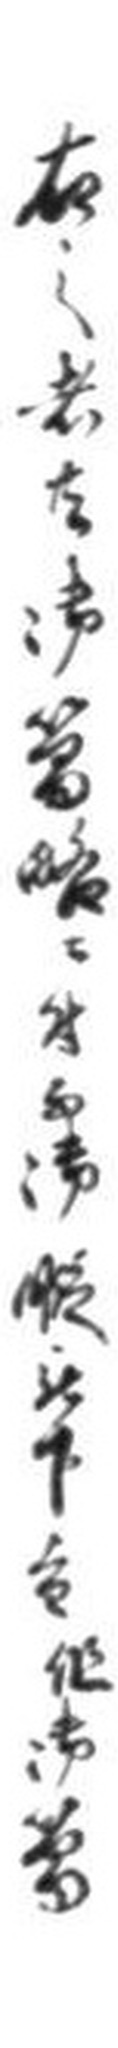右之者共御簡略ニ付而御暇被下旨但御簡
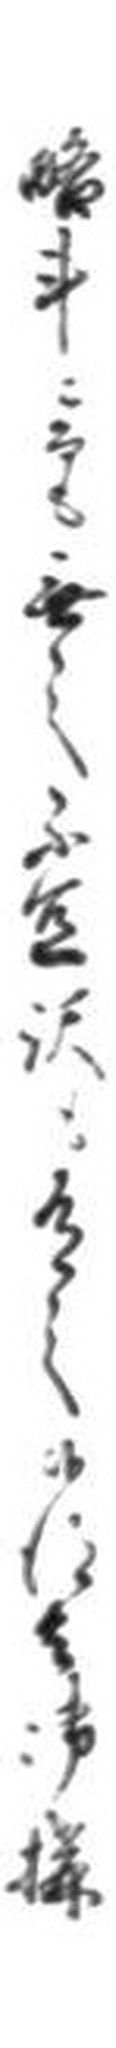略斗ニ而も無之不宜訳も有之候得者御構
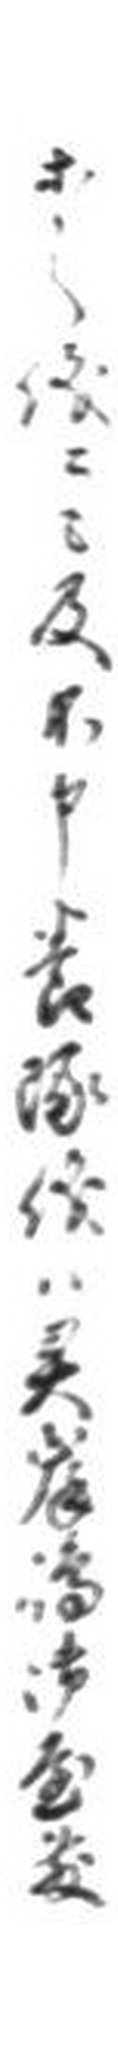等之儀ニも及不申養琢儀ハ霊岸嶋御屋敷
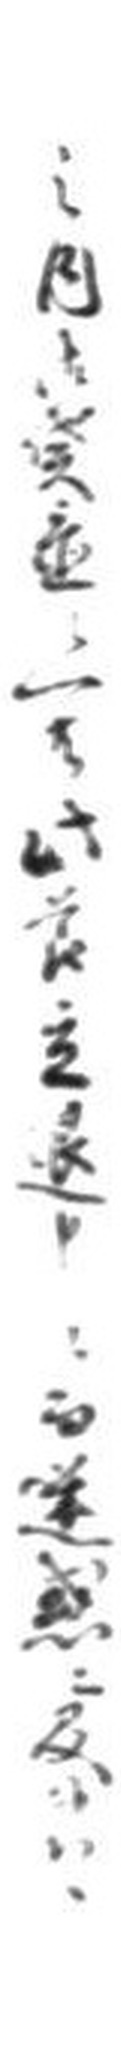之内御貸置候へ共此節立退申ニ而迷惑ニ及候ハヽ
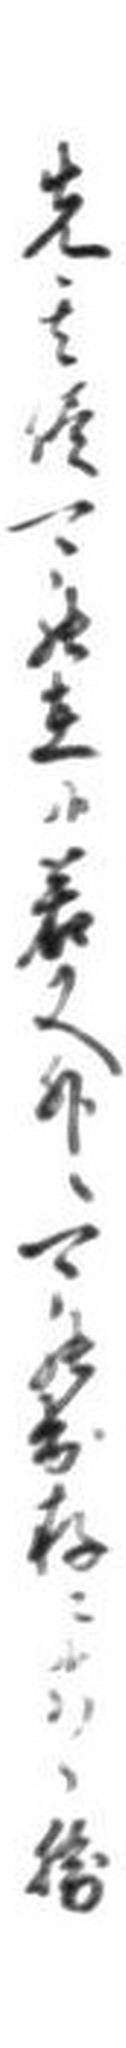先其儘可罷在候若又外へ可罷出存ニ候ハヽ勝
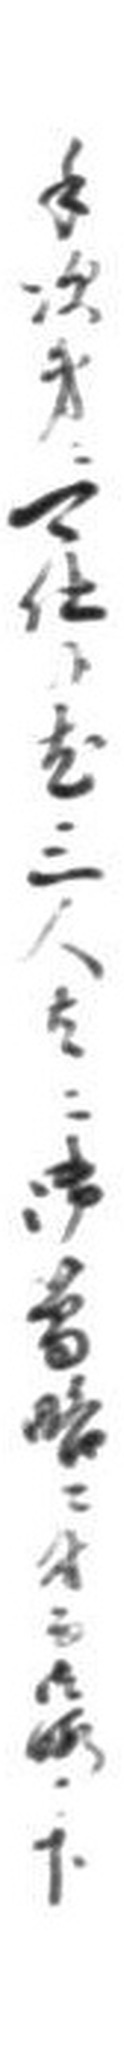手次第ニ可仕候尤三人共ニ御簡略ニ付而御暇被下
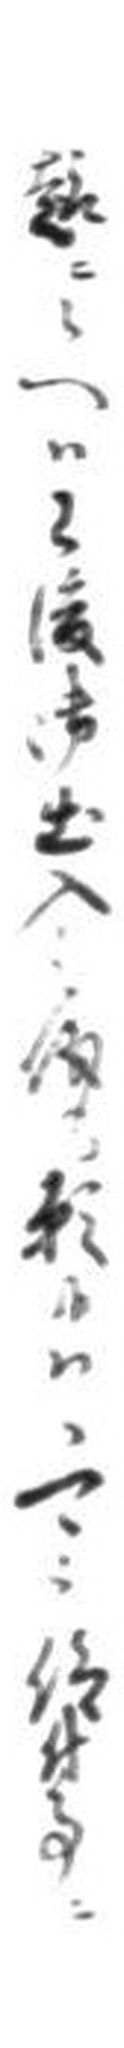趣ニ候ヘハ已後御出入之儀も願候ハヽ可被仰付事ニ
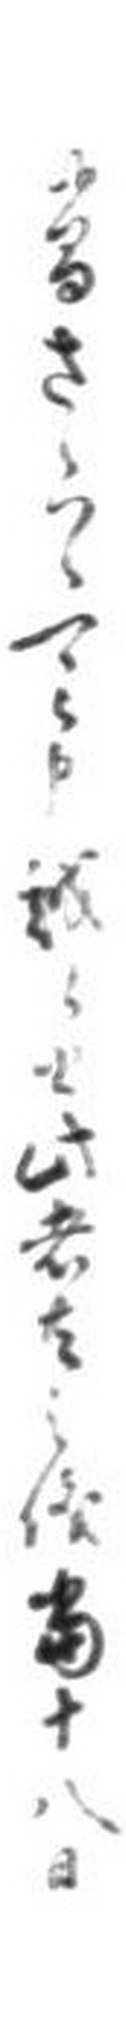候間さ候ハヽ可被申越候由此者共之儀当十八日
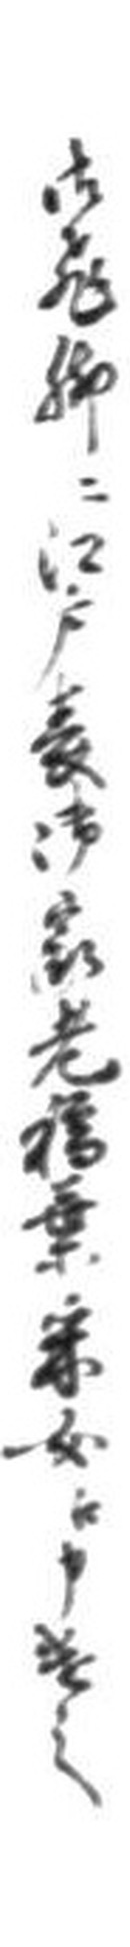御飛脚ニ江戸表御家老稲葉采女江申遣之
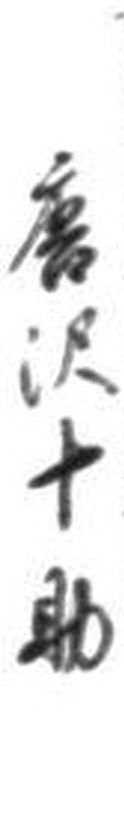唐沢十助
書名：家譜 三十六 宗昌公 従享保八年到同九年
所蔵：福井県文書館 Fukui Prefectural Archives
